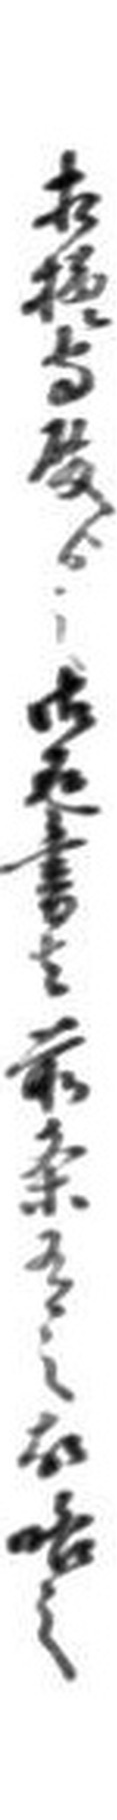相模守殿ゟ之御返事者前条有之故略之
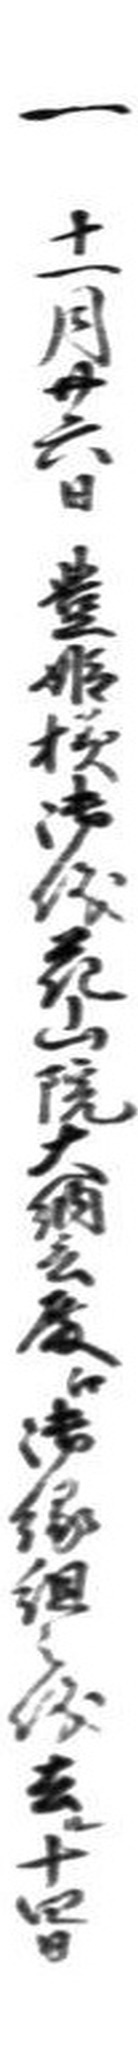一十一月廿六日豊姫様御儀花山院大納言殿江御縁組之儀去ル十四日
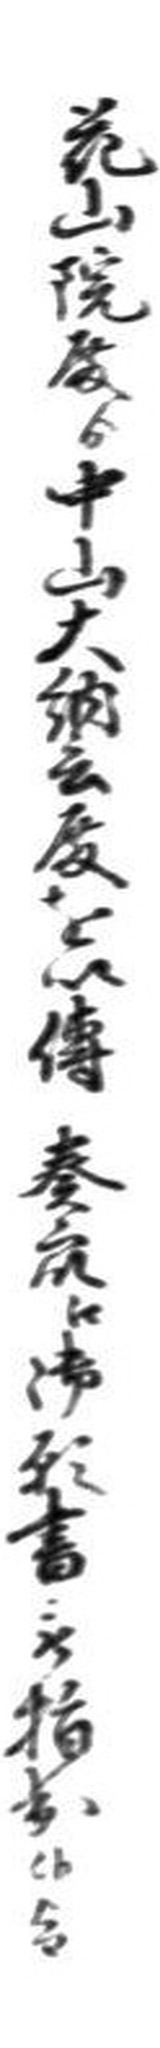花山院殿ゟ中山大納言殿を以伝奏衆江御願書被指出候旨
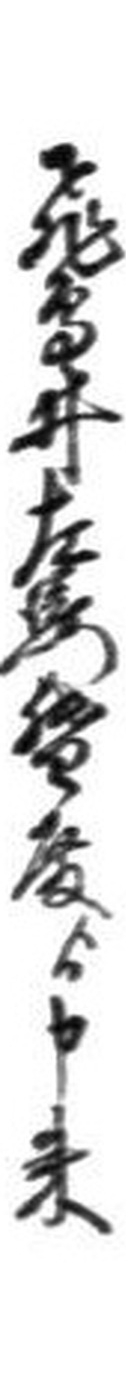飛鳥井左衛門督殿ゟ申来

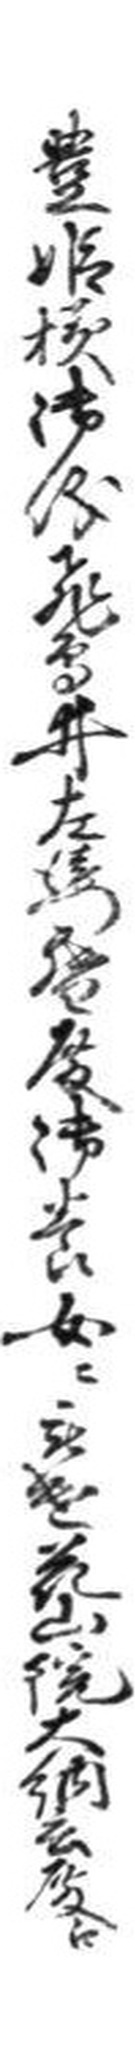豊姫様御儀飛鳥井左衛門督殿御養女ニ被遣花山院大納言殿江
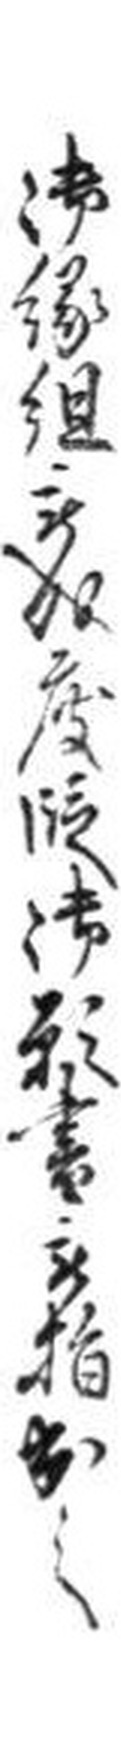御縁組被成度段御願書被指出之
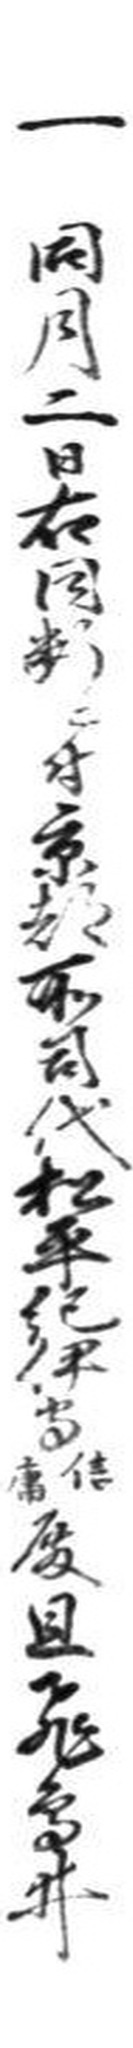一同月二日右同断ニ付京都所司代松平紀伊守信庸殿且飛鳥井
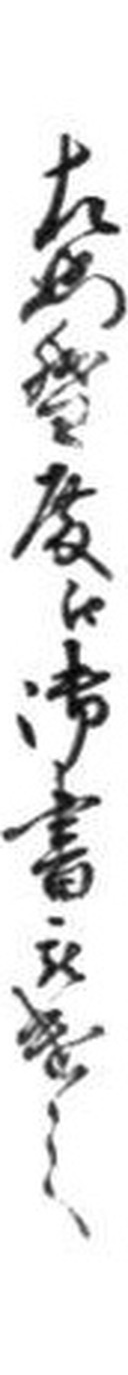右衛門督殿江御書被遣之
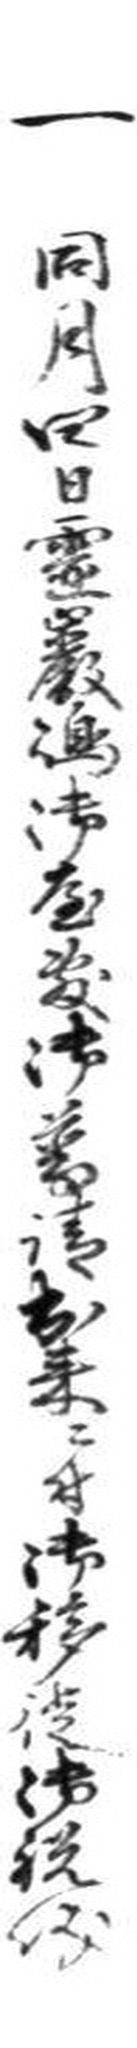一同月四日霊巌嶋御屋敷御普請出来ニ付御移徙御祝儀
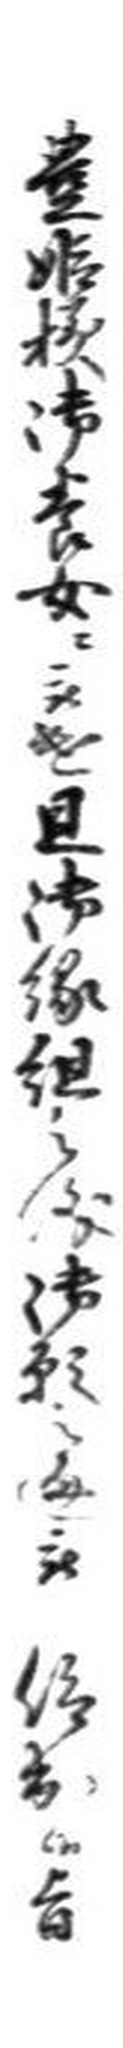豊姫様御養女ニ被遣且御縁組之儀御願之通ニ被仰出候旨
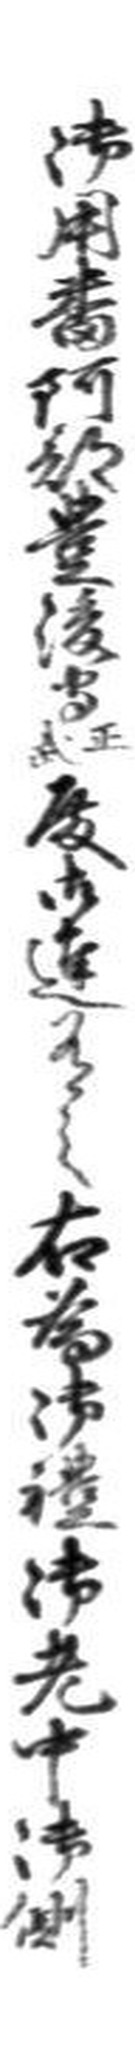御用番阿部豊後守正武殿御達有之右為御礼御老中御側
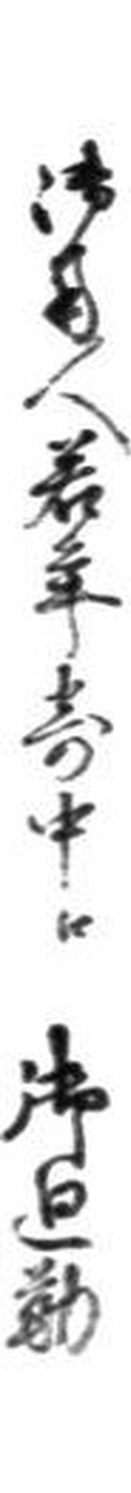御用人若年寄中江御廻勤
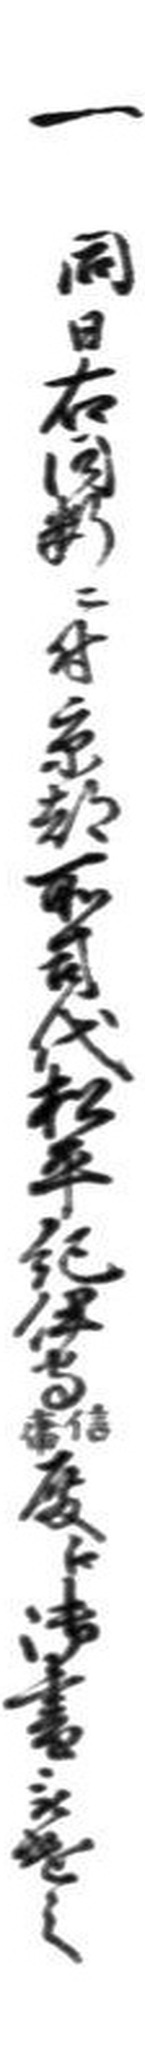一同日右同断ニ付京都所司代松平紀伊守信庸殿江御書被遣之
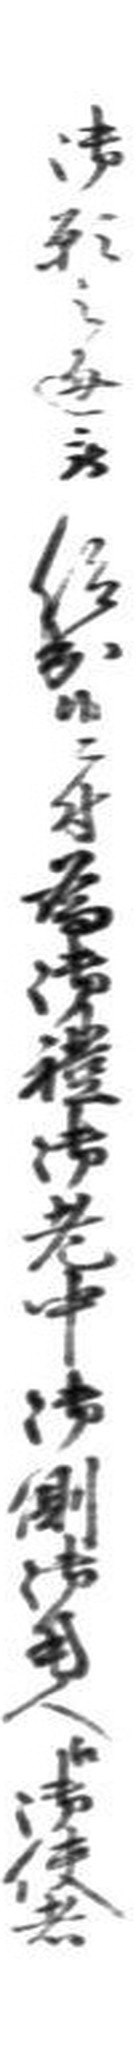御願之通被仰出候ニ付為御礼御老中御側御用人江御使者
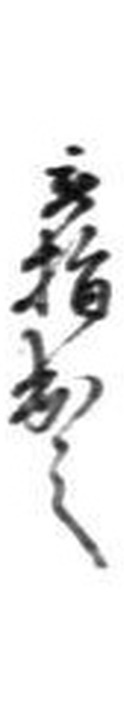被指出之
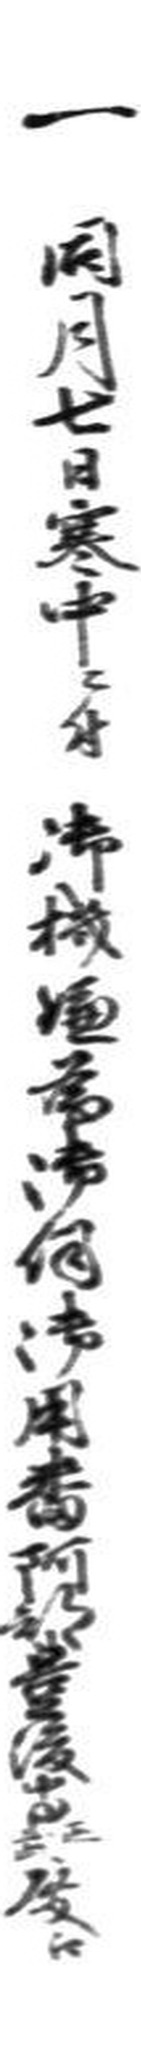一同月七日寒中ニ付御機嫌為御伺御用番阿部豊後守正武殿江
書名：家譜 二十一 吉品公 従元禄十三年到同十四年
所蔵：福井県文書館 Fukui Prefectural Archives
